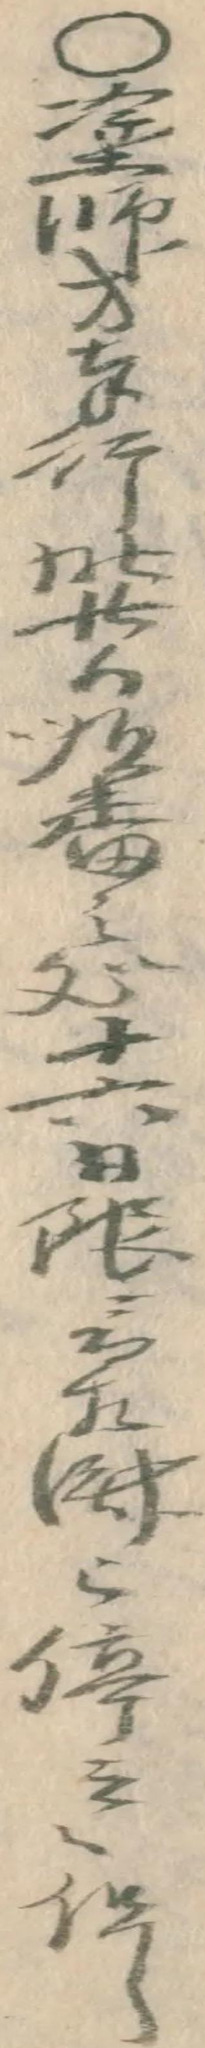○塗師方奉行昨廿日順番之処十六日限ニ而相済被停云々但し
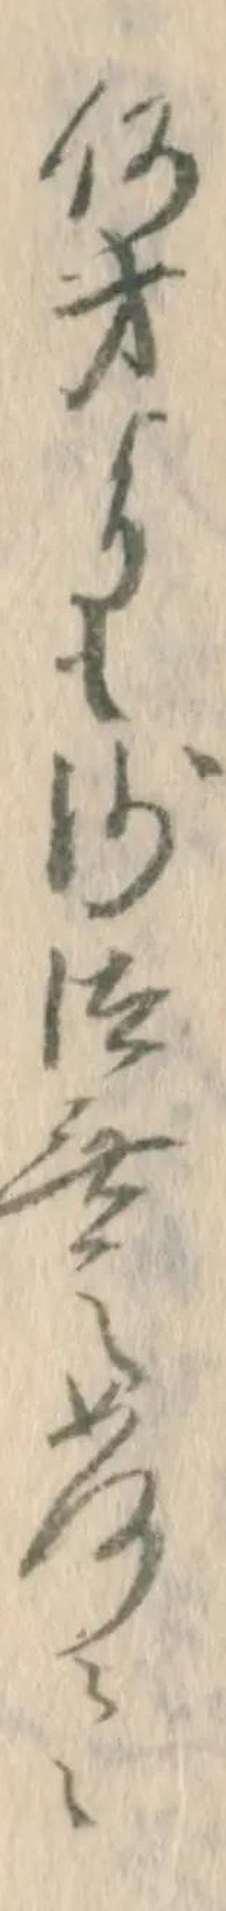何方よりも沙汰無之如例云々
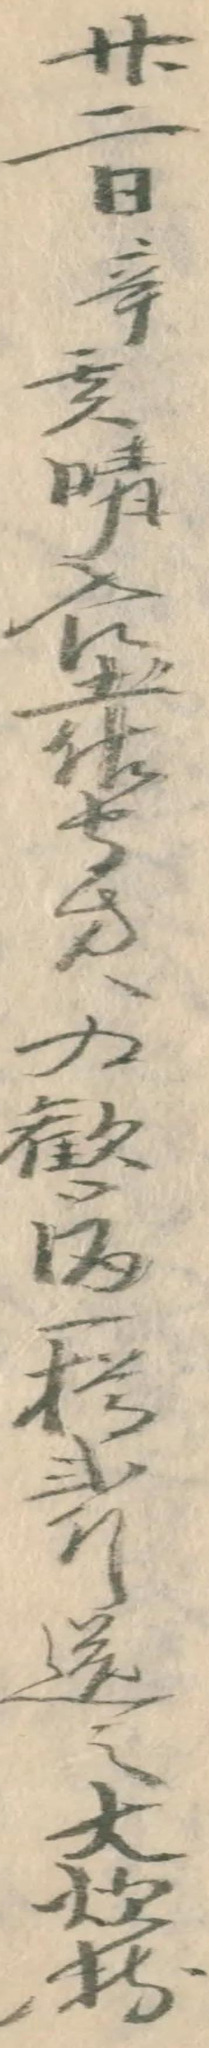廿二日辛亥晴入江土佐守方へ為勧御酒一樽弐升送之大炊持
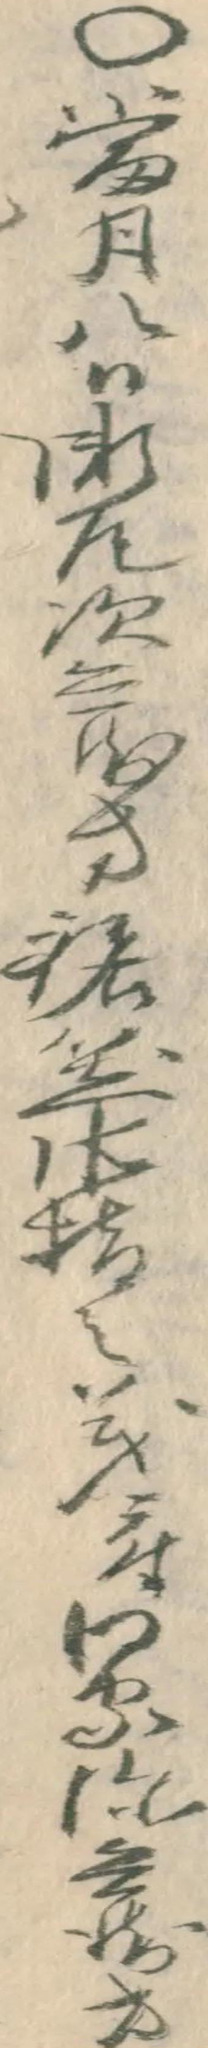○當月八日瀬尾次兵衛方銘器水指之義ニ付同家弥兵衛弟
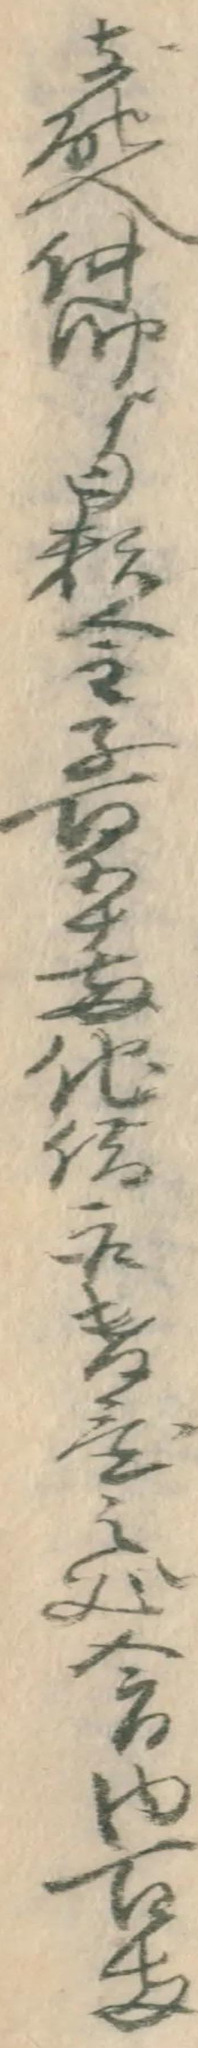支配人仲助より被頼金子百五十両他借取替置之処今日内百両

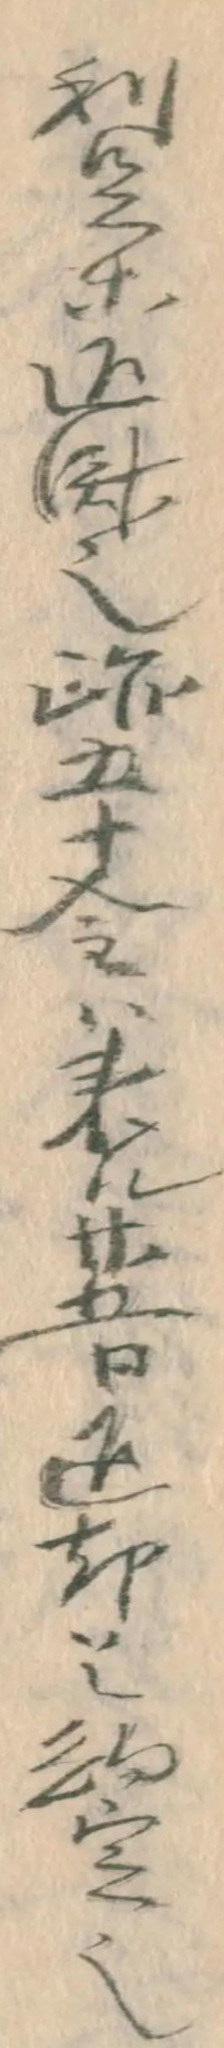利足等退済也跡五十金ハ来ル廿五日退却之約定也
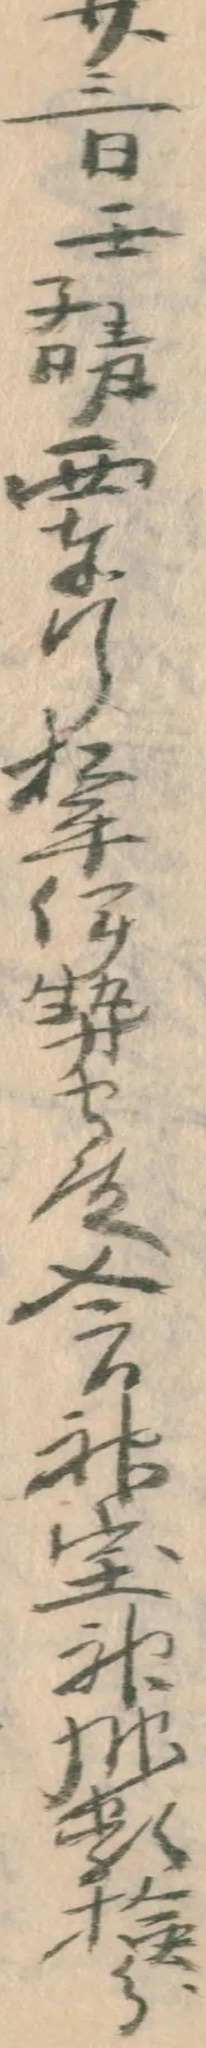廿三日壬子晴西奉行松平伊勢守殿今日神宝神服頼検分
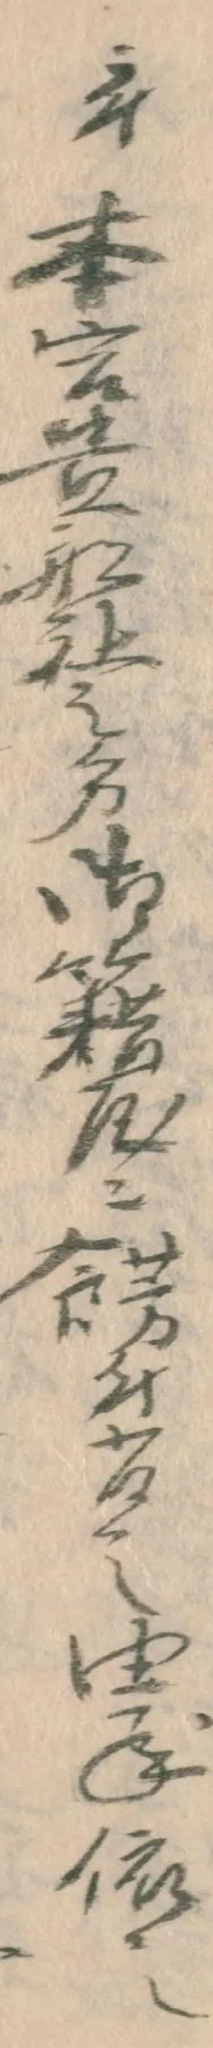ニ付本宮貴舩社之分御籍屋に餝付有之由承依之
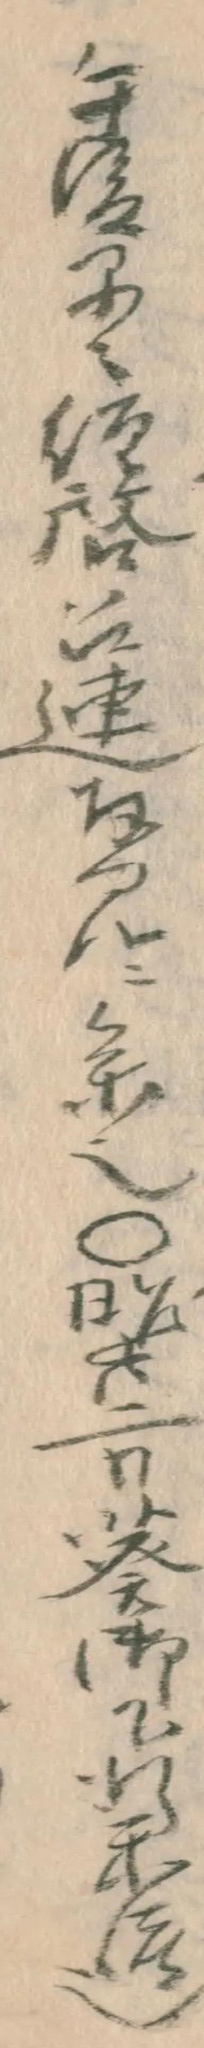午後早々経啓召連相見ニ参也○昨廿二日葵御下行米渡也
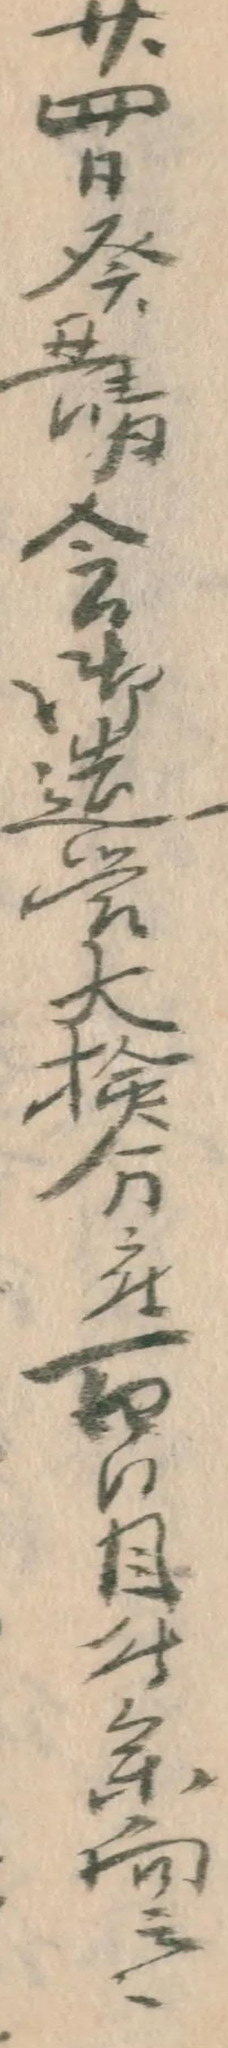廿四日癸丑晴今日御造営大検分ニ付百日目付参向云々
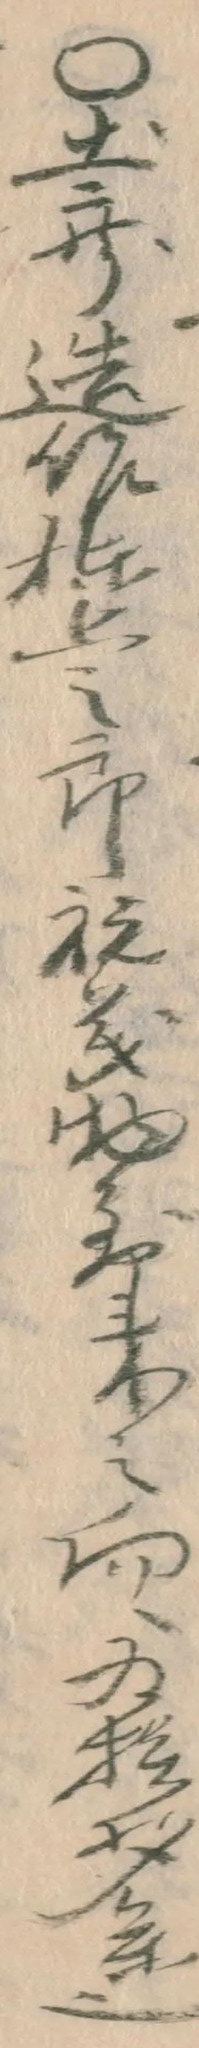○土蔵造作棟上之節祝義物到来之向へ為挨拶参也
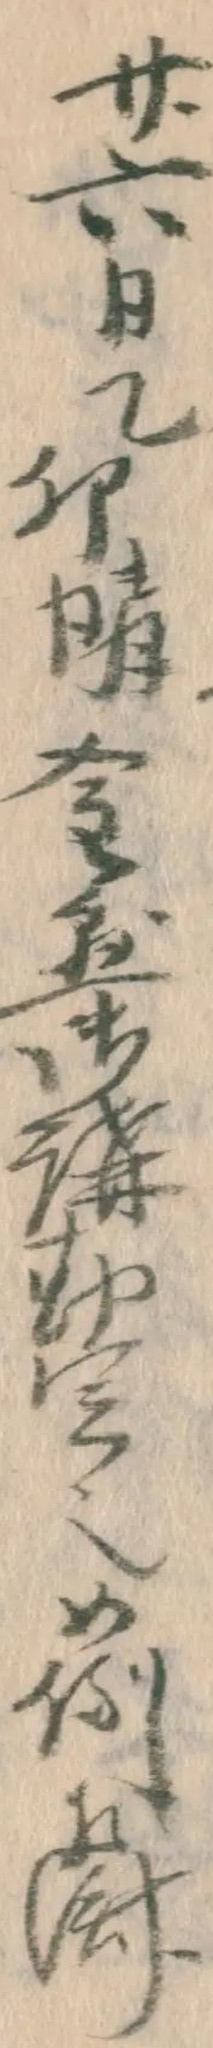廿六日乙卯晴金懸御講勘定也如例相済
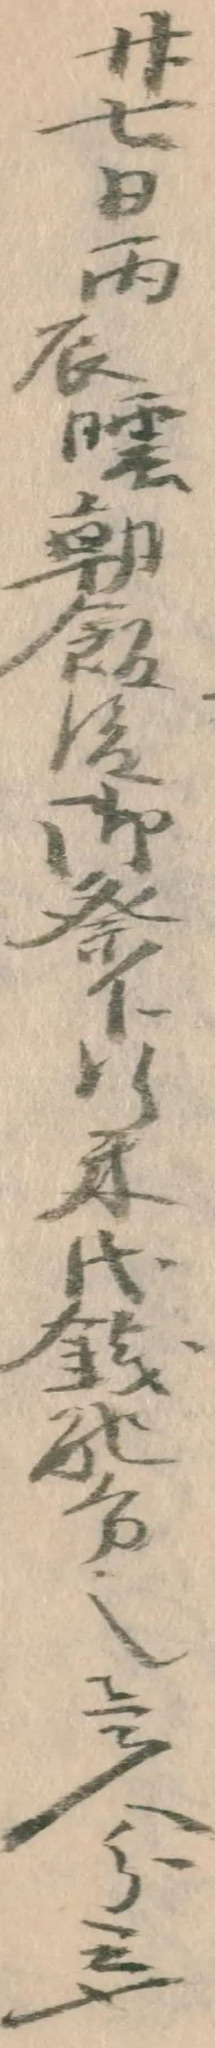廿七日丙辰曇朝飯後御祭下行米代銭配分也壱人分三〆
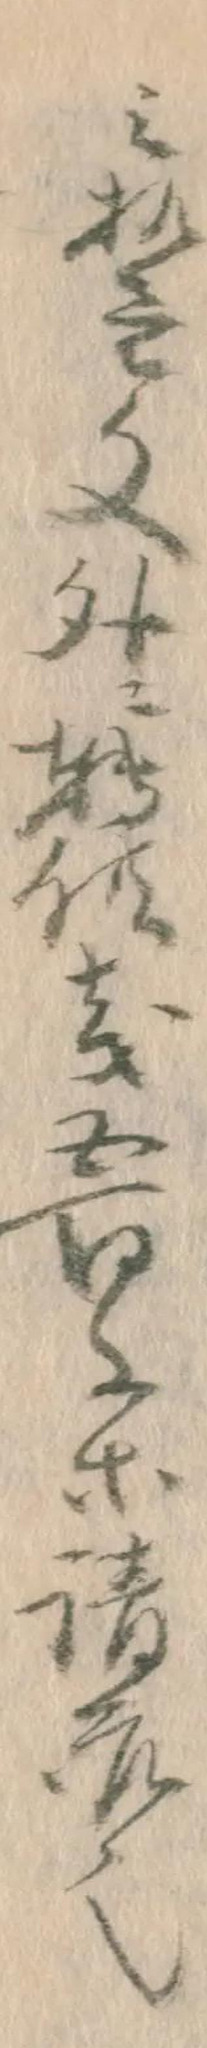之払壱文外ニ轉供義五百文等請取也
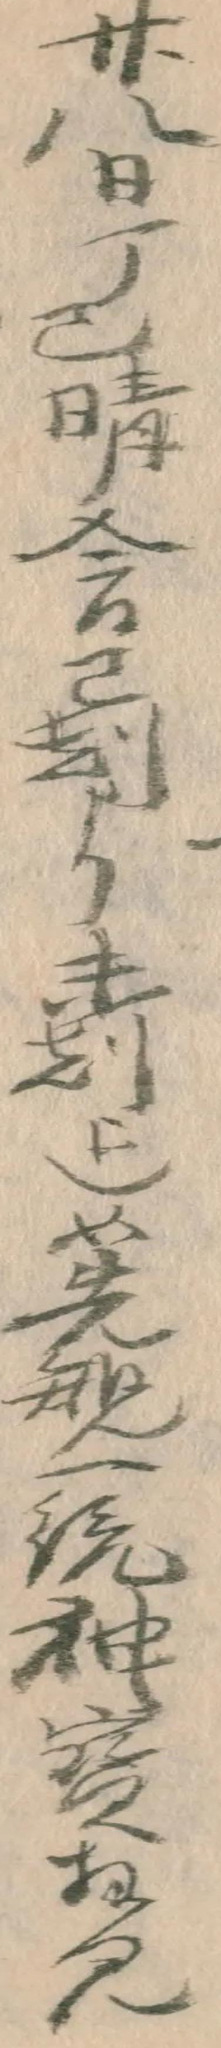廿八日丁巳晴今日巳刻より未刻迄如先親一統神寶拝見
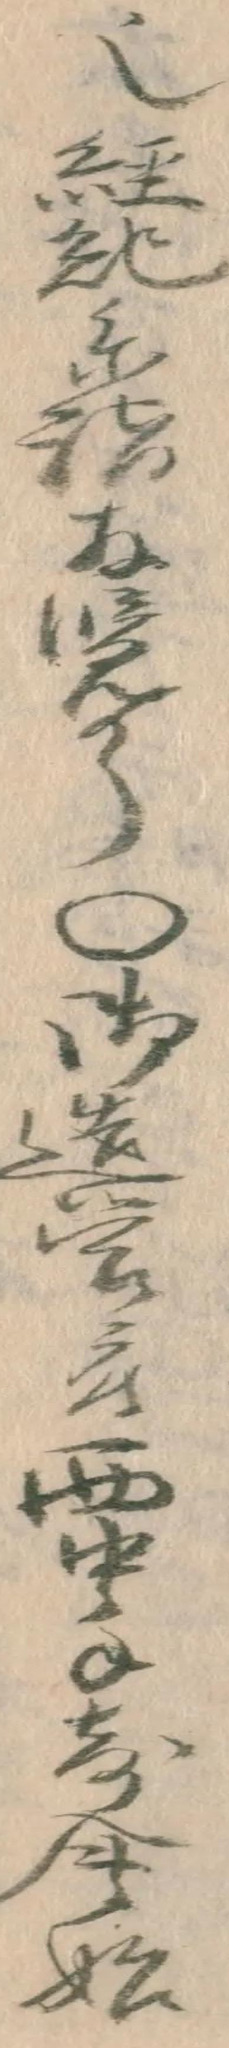也経紀参詣相覧了〇御造営ニ付西中手寄會始
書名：賀茂社記録. 第67冊
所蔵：国立国会図書館 National Diet Library, JAPAN
